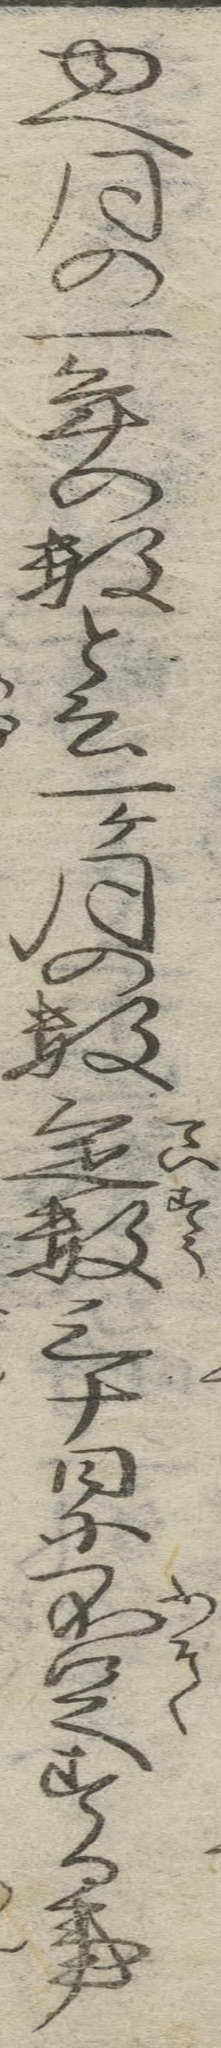ゆへ月の一年の数と云一ヶ月の数定数三十日に不足する事
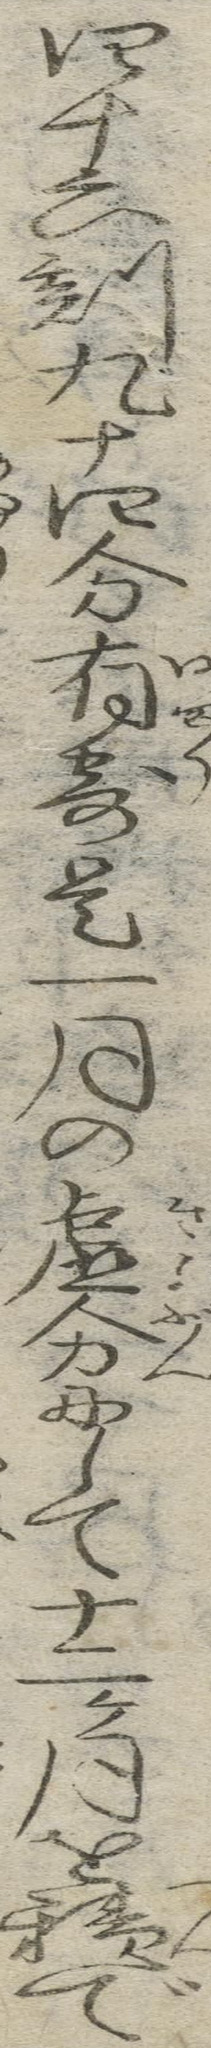四十六刻九十四分有奇是一月の虚分にして十二ヶ月を積で
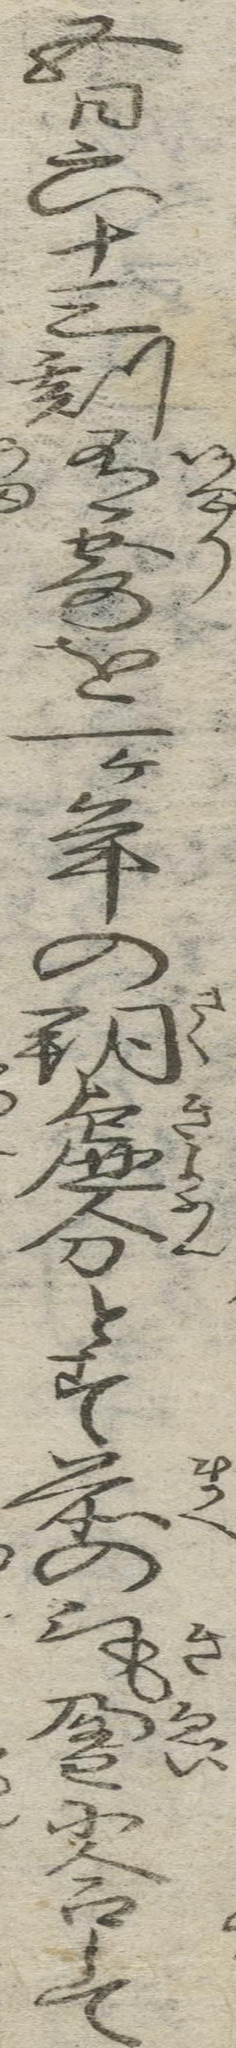五日六十三刻有奇を一ヶ年の朔虚分とす前の気盈に合して
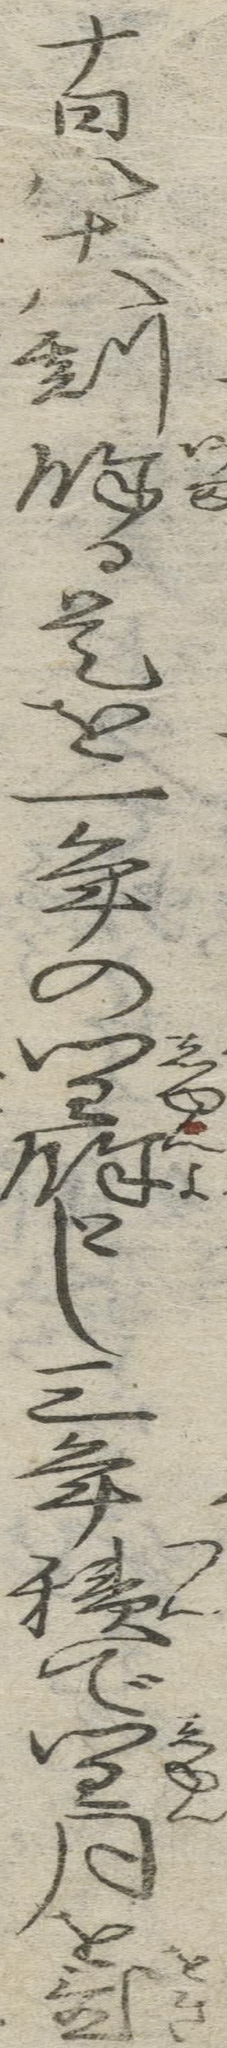十日八十八刻余る是を一年の閏余とし三年積で閏月を置
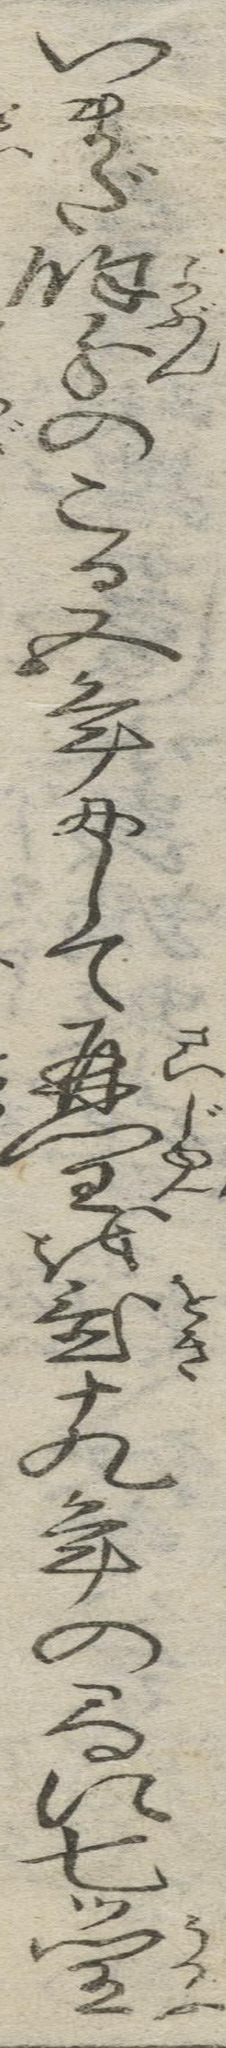いまだ余分のこる五年にして再閏を置十九年の間に七ッ閏
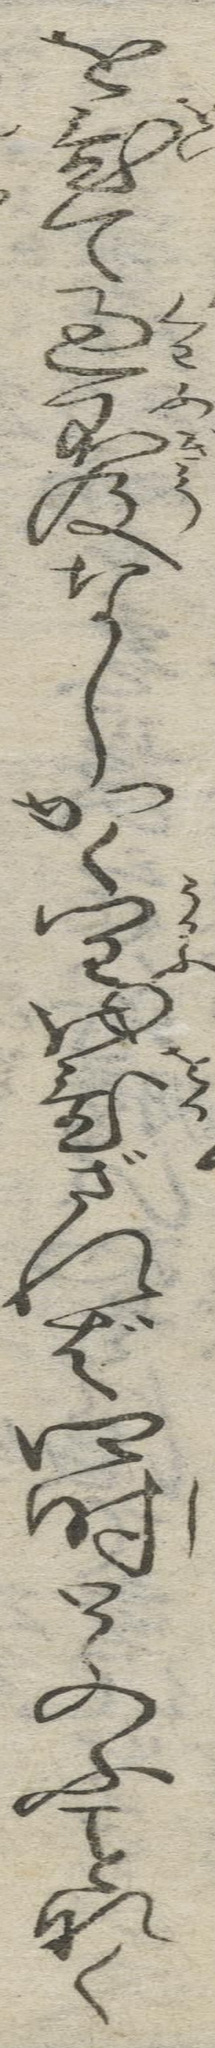を置て過不及なしかく閏を置ざれば四時とゝのふことなく
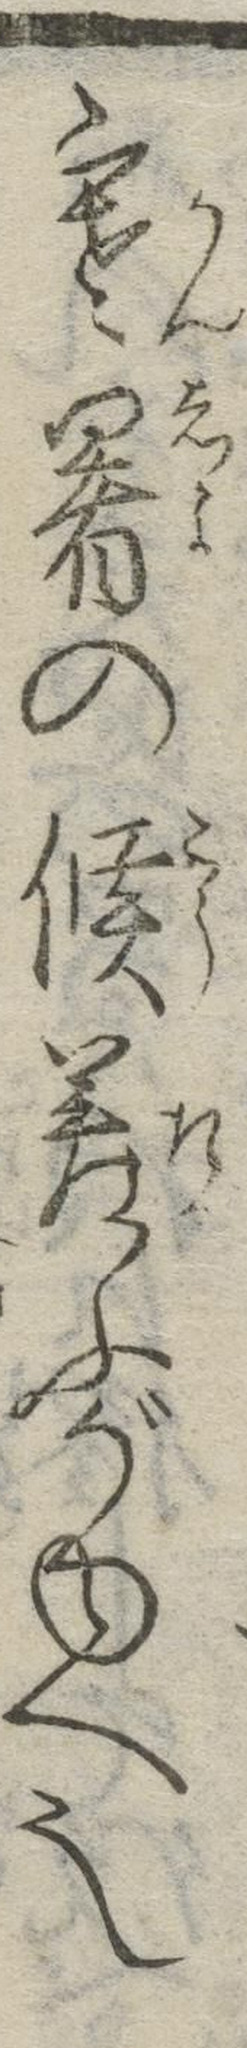寒暑の候差ふがゆへ也
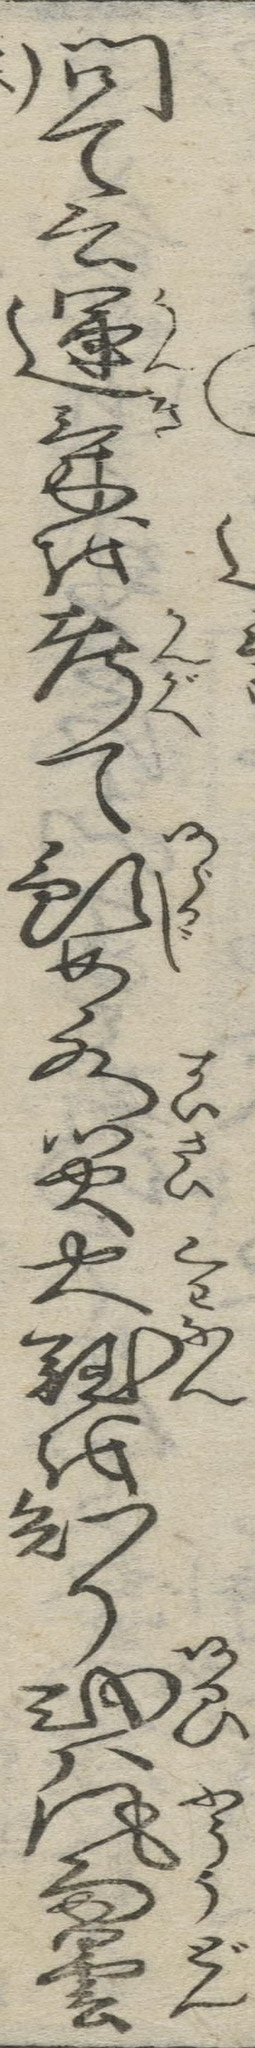問て云運気を考て預め水災火難を知り或は風雨曇
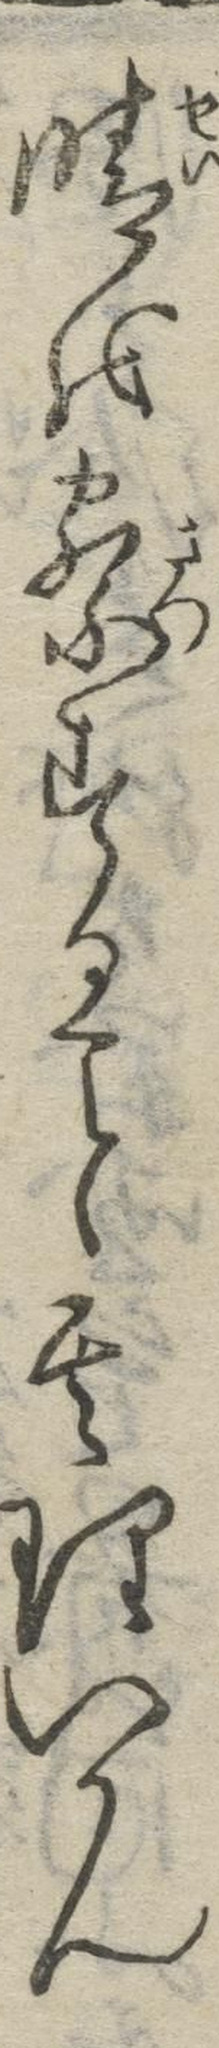晴を察すること其理いかん
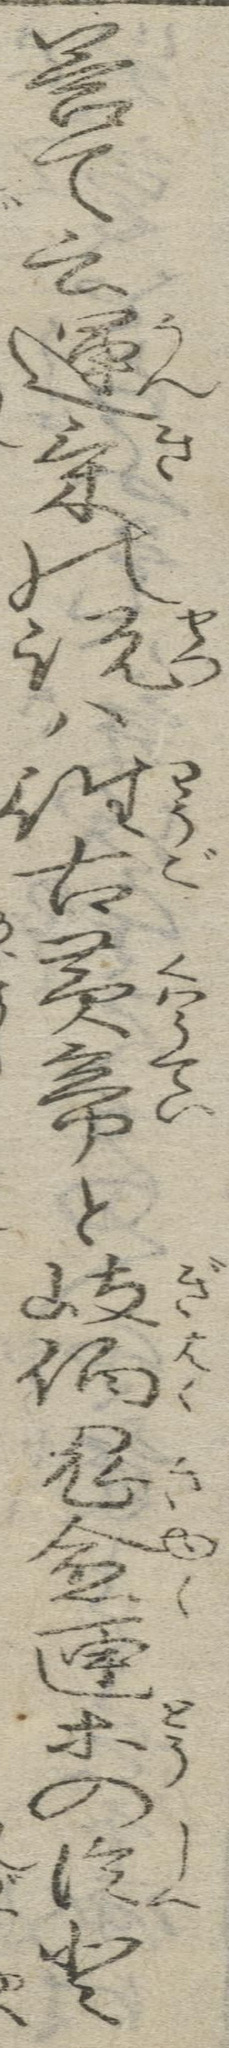答て云運気の説は往古黄帝と岐伯鬼愈匣等の信と
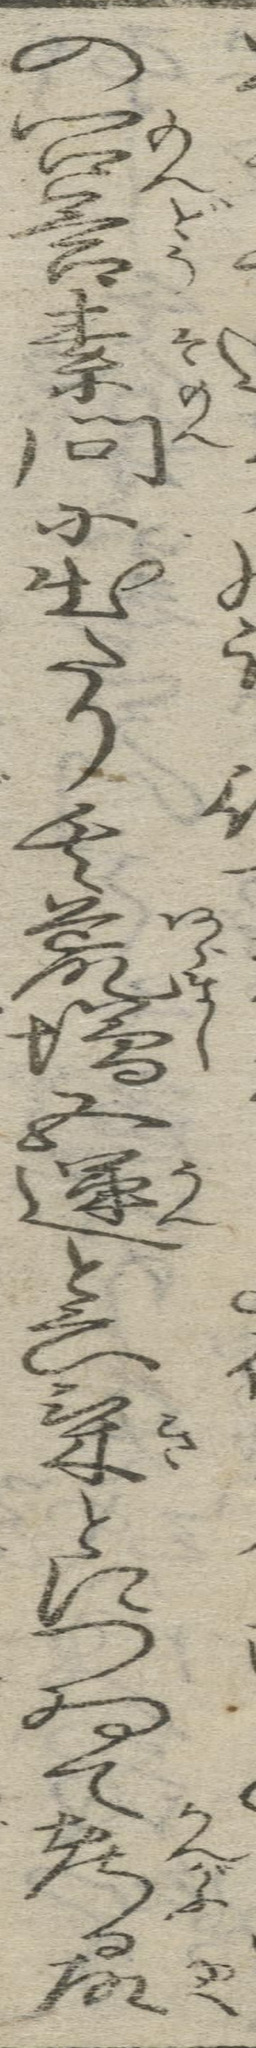の問答素問に出たり其荒増五運と云気とにつゐて考る故
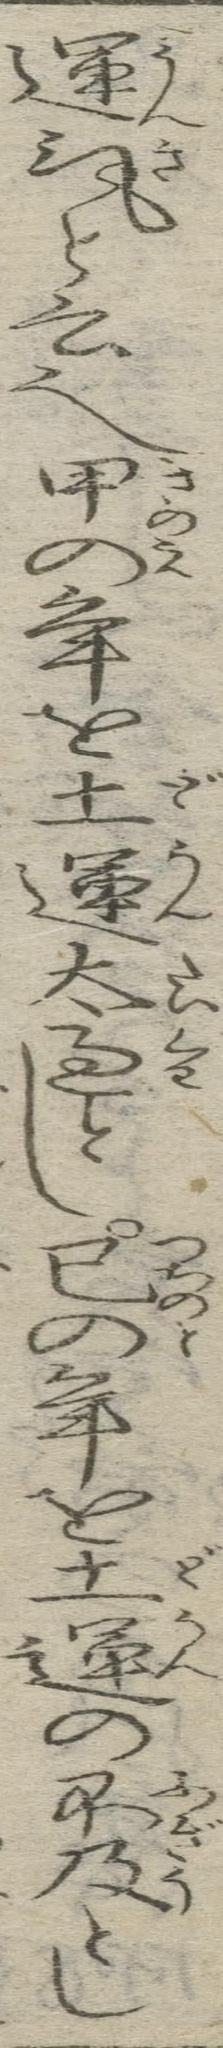運気と云也甲の年を土運太過とし。己の年を土運の不及とし
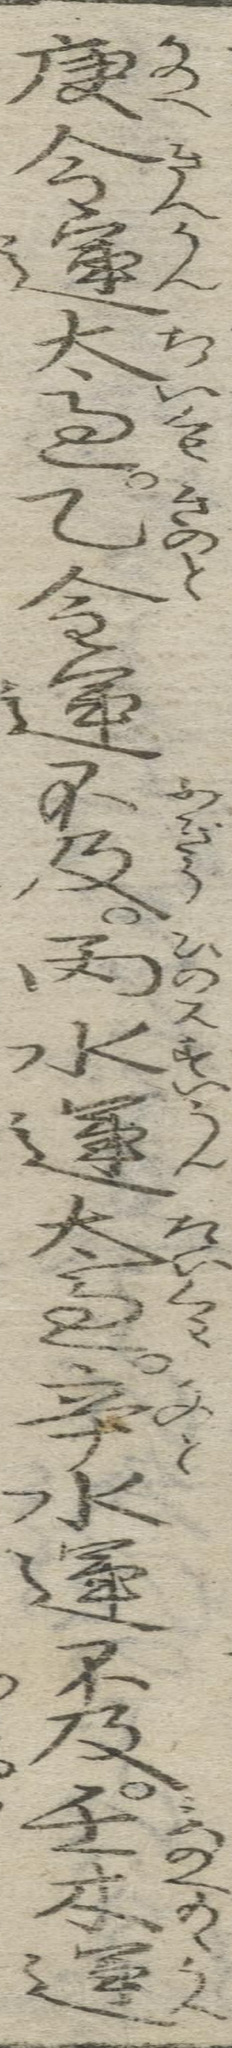庚金運太過。乙金運不及。丙水運太過。辛水運不及。壬木運
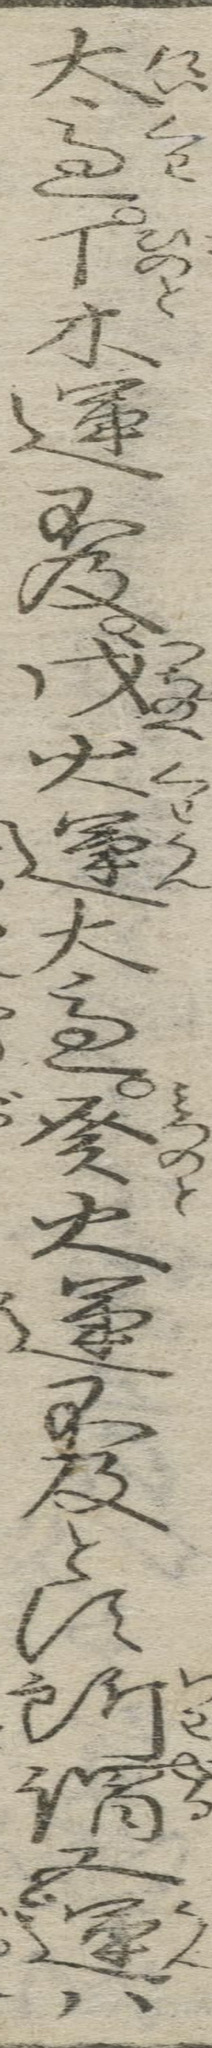太過。丁木運不及。戊火運太過。癸火運不及とす所謂五運は
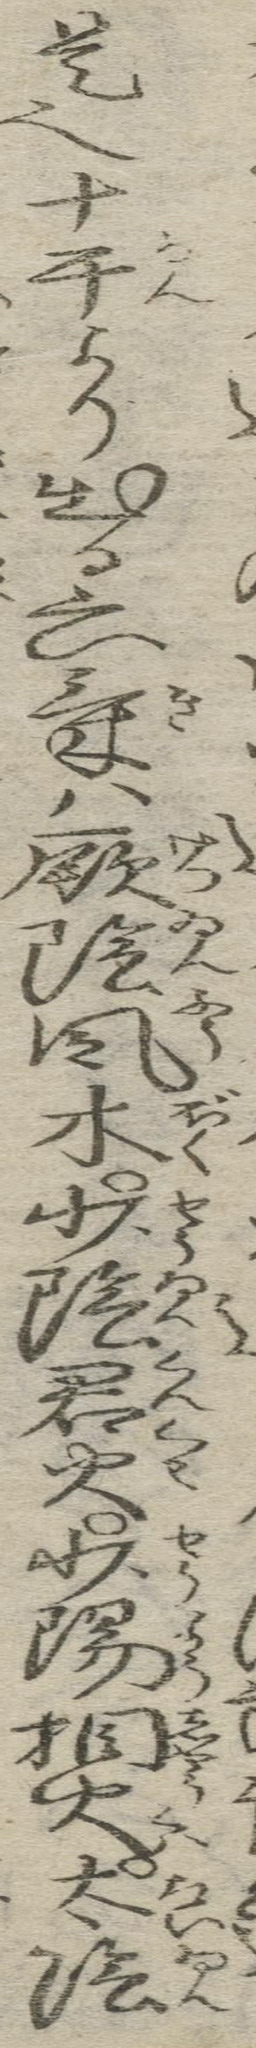是也十干より出る六気は厥陰風木。少陰君火。少陽相火。太陰
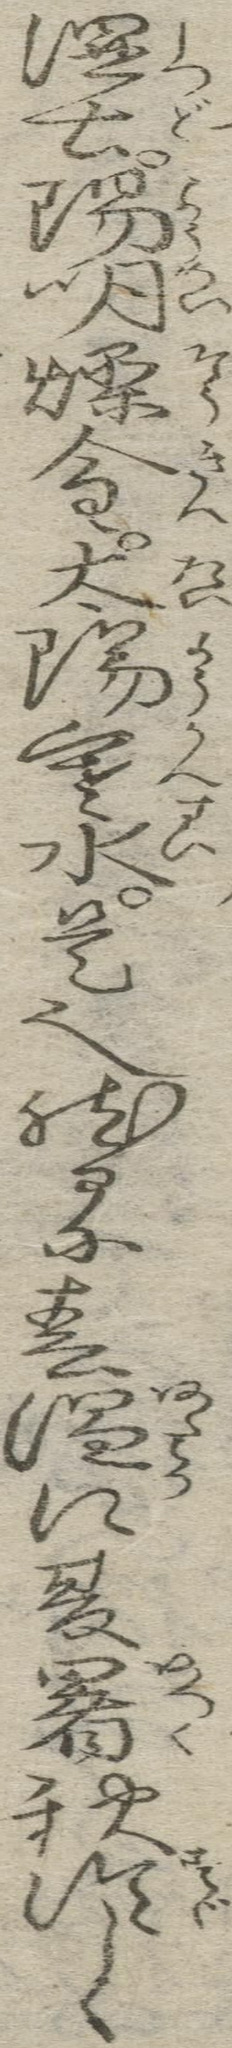湿土。陽明燥金。太陽寒水。是也然るに春温に夏暑秋涼しく
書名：訓蒙天地辨　天
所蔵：東京大学地震研究所図書室 Earthquake Research Institute Library, The University of Tokyo, JAPAN
